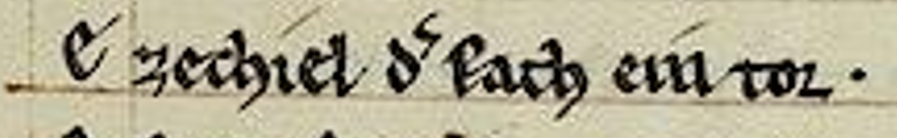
Ezechiel d(er) ſach ein tor.
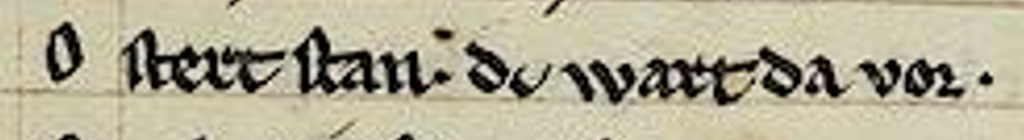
Oſtert ſtan. d(az) wart da vor.
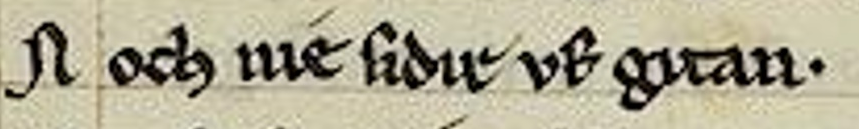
Noch nie ſidir vf gitan.
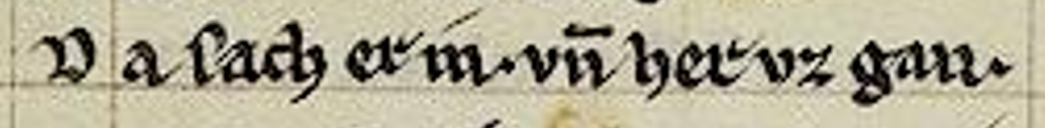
Da ſach er in. vn(d) her vz gan.
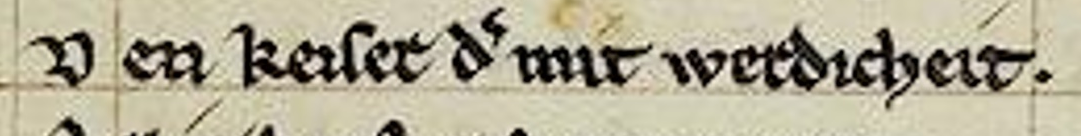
Den keiſer d(er) mit werdicheit.
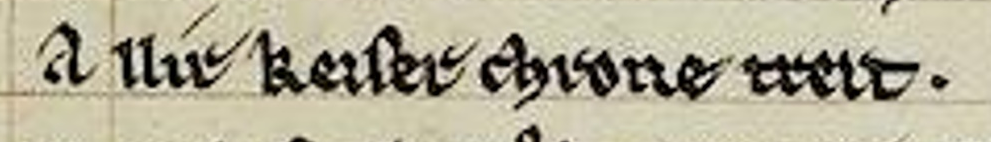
Allir keiſer chrone treit.
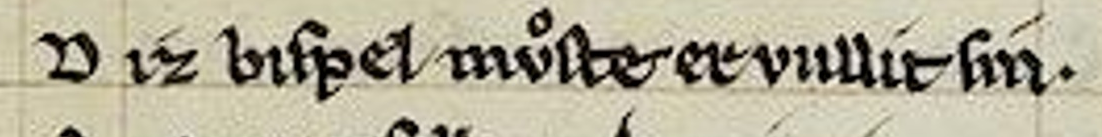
Diz biſpel mv°oſter vullit ſin.
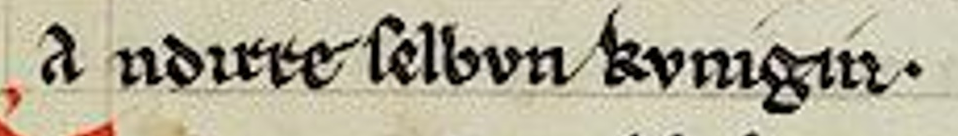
Andirre ſelbvn kvnigin.
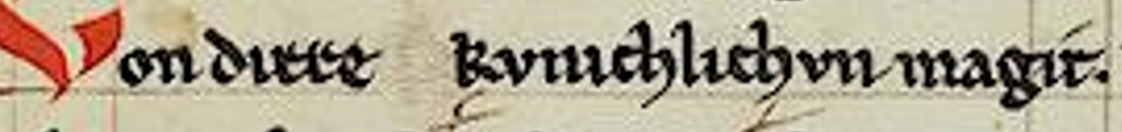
*Von dirre kvnichlichvn magit.
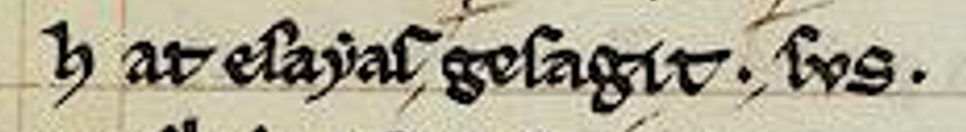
Hat eſayaſ °(+) geſagit. °(+) ſvs.
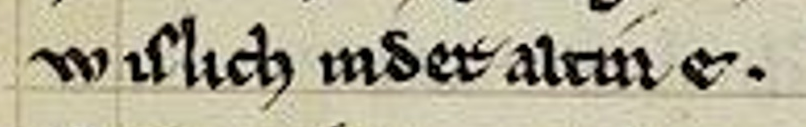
Wiſlich in der altin e.
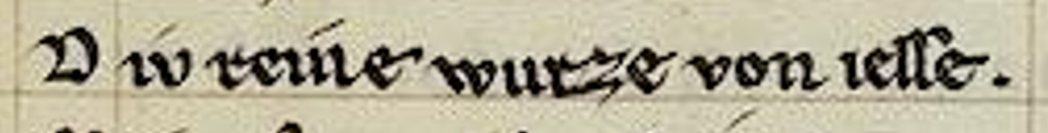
Div reine wurze von ieſſe.
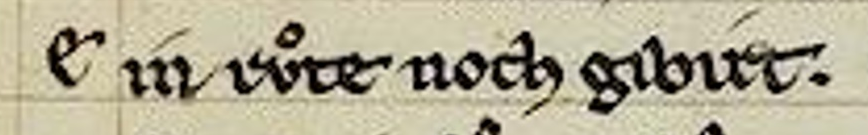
Ein rv°ote noch gibirt.
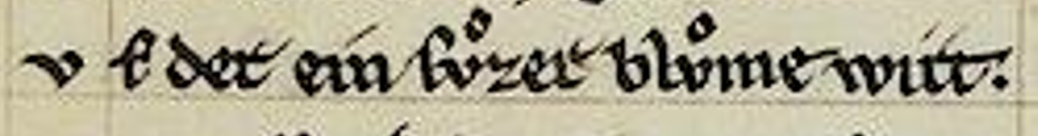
Vf der ein ſv°ozer blv°ome wirt.
